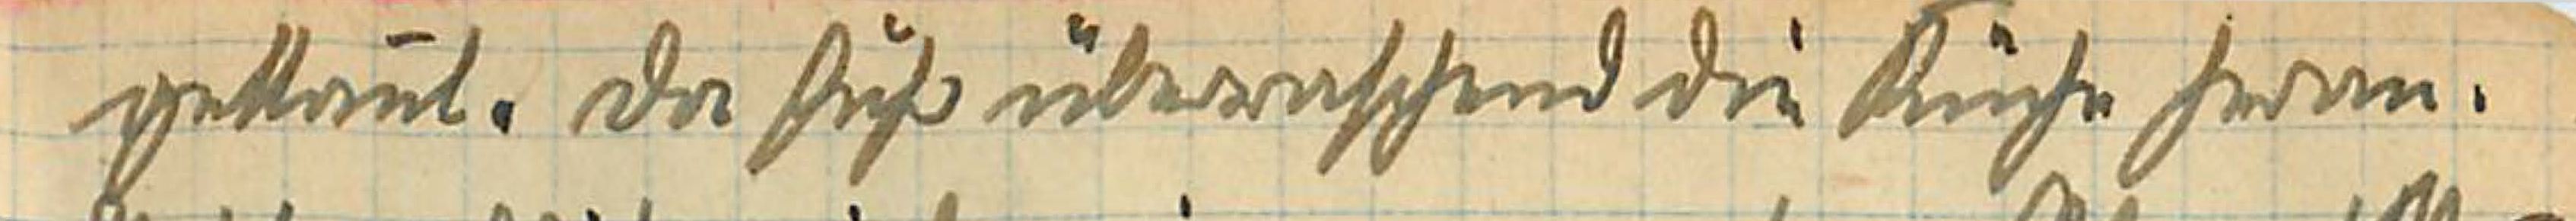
gekaut. Da fuhr überraschend die Küche heran.
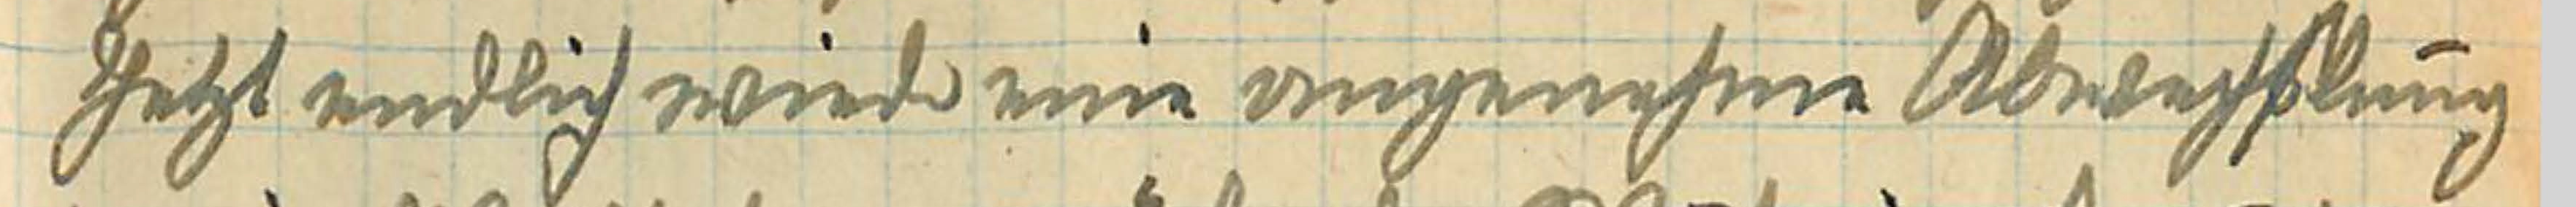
Jetzt endlich wieder eine angenehme Abwechslung
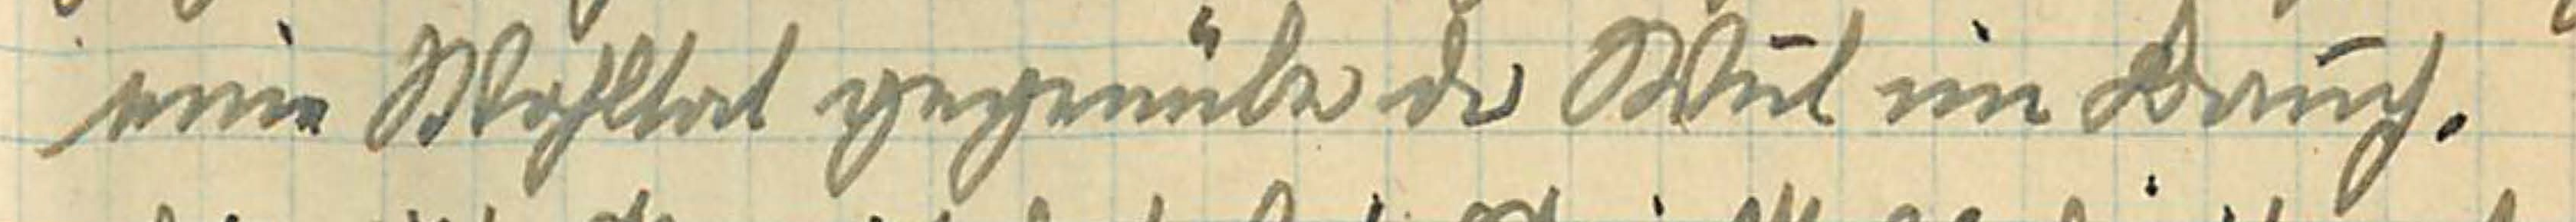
eine Wohltat gegenüber der Wut im Bauch.
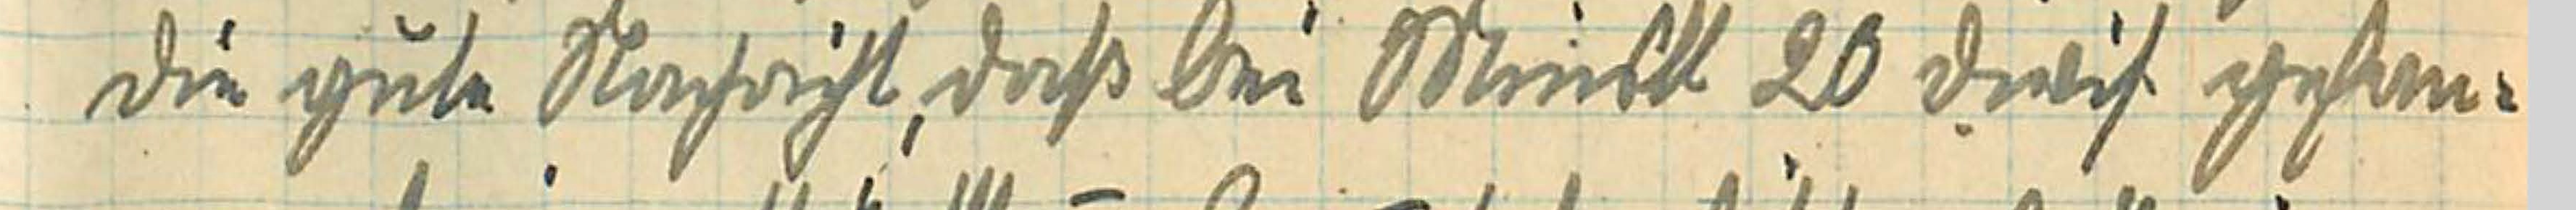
Die gute Nachricht, daß bei Minsk 20 Divis. gefan-
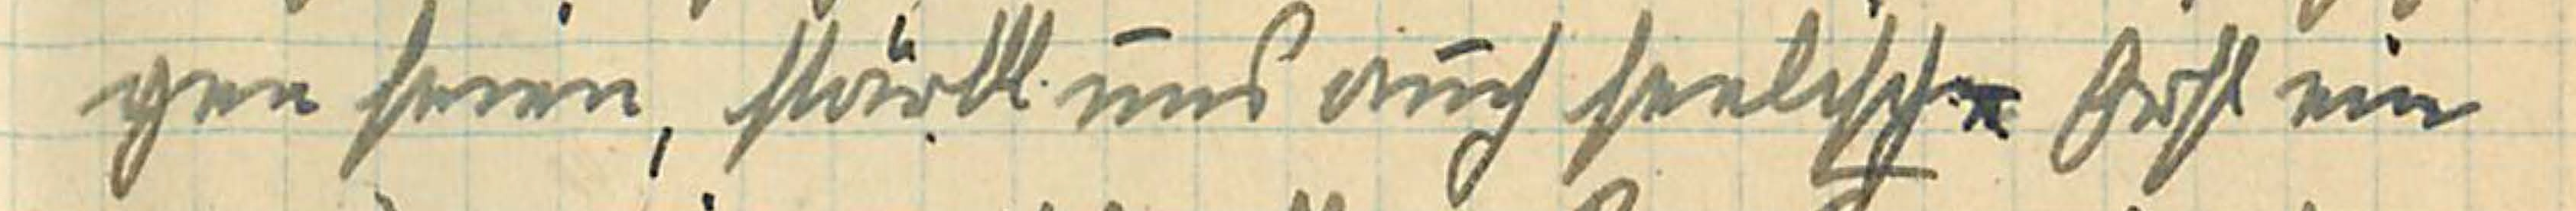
gen seien, stärkt uns auch seelische. Erst ein
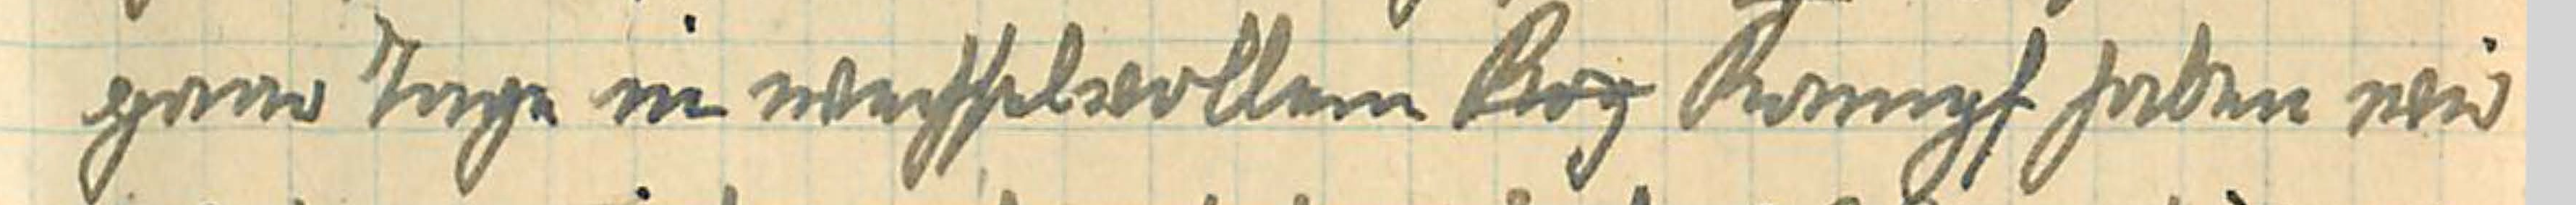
paar Tage in wechselvollem Rog Kampf haben wir
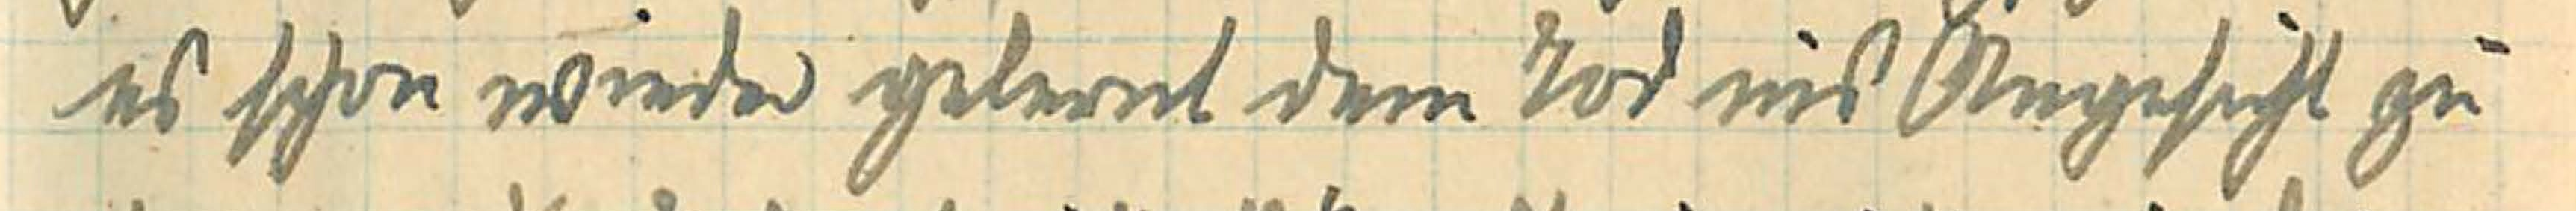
es schon wieder gelernt dem Tod ins Angesicht zu
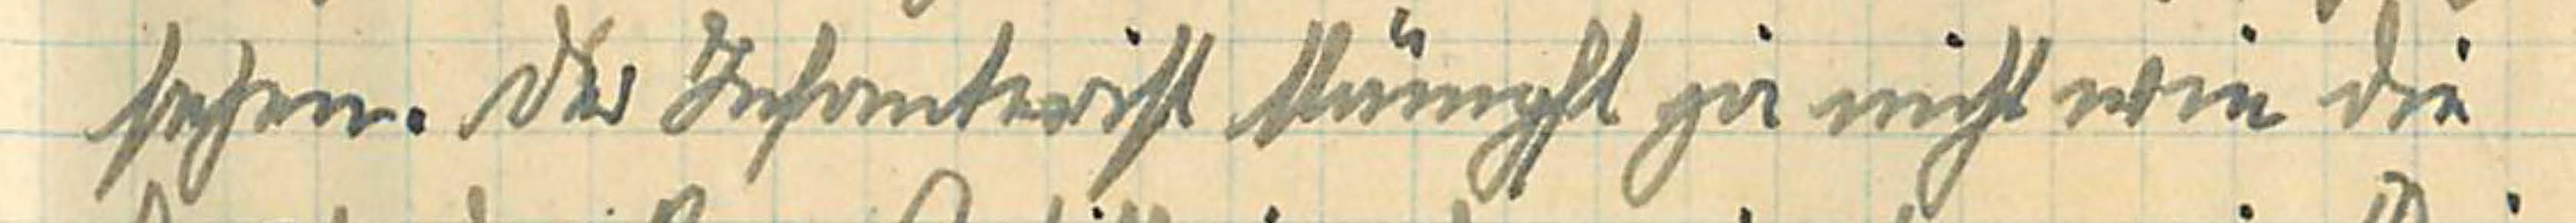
sehen. Der Infanterist kämpft ja nicht wie die
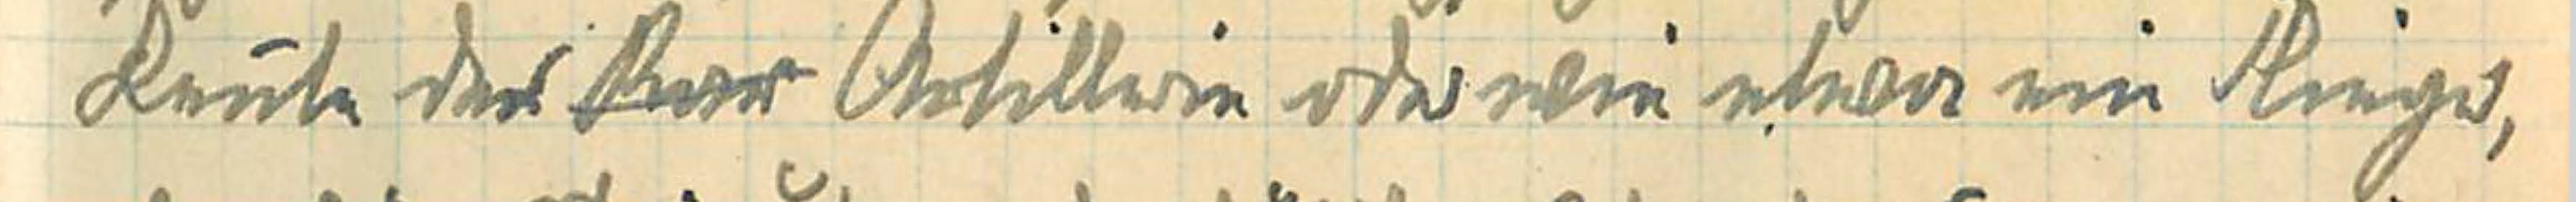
Leute der Rar Artillerie oder wie etwa ein Flieger,
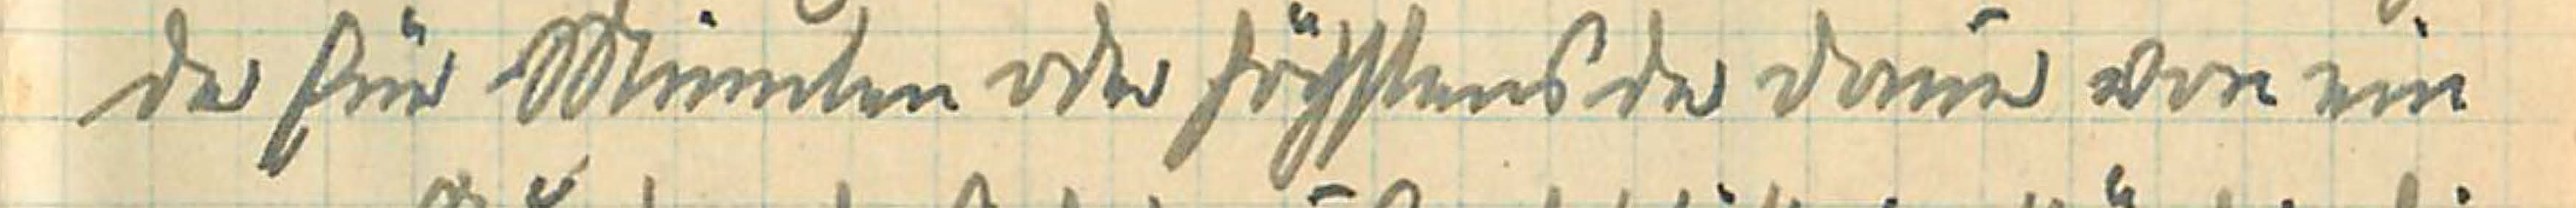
der für Minuten oder höchstens der Dauer von ein
